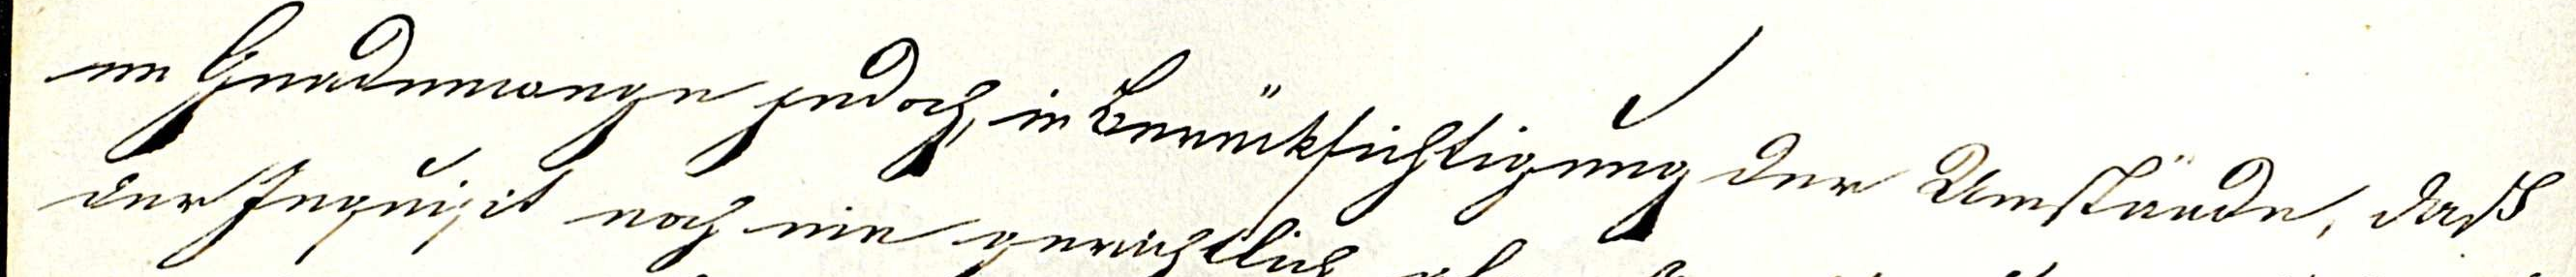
xx Gnademange jedoch, in Berücksichtigung der Umstände, daß
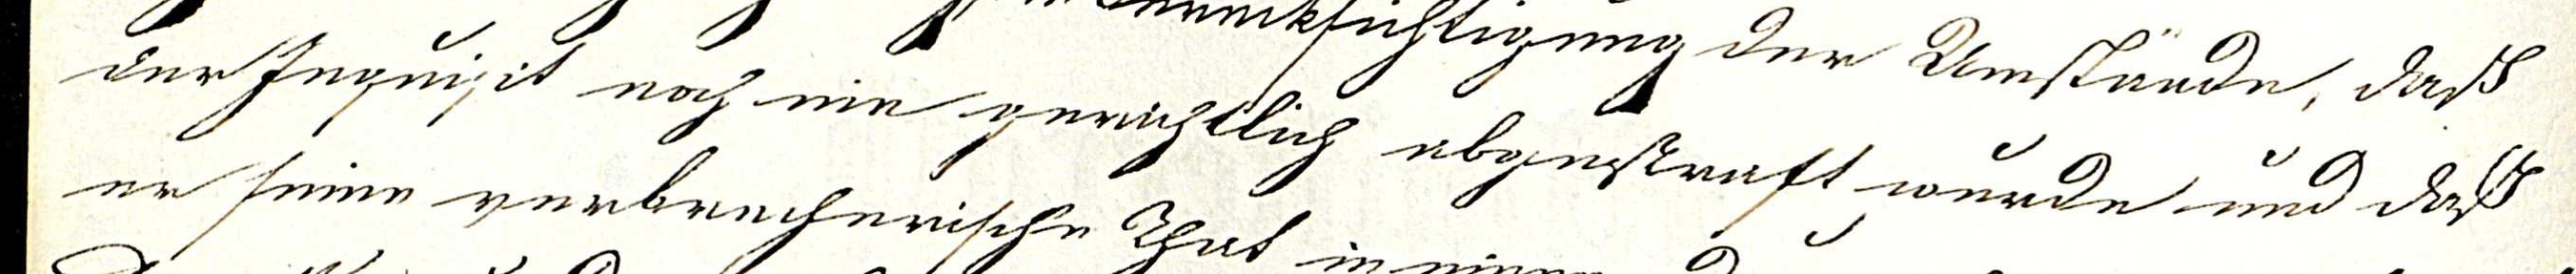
der Jnquisit noch ein gerichtlich abgestraft wurde und daß
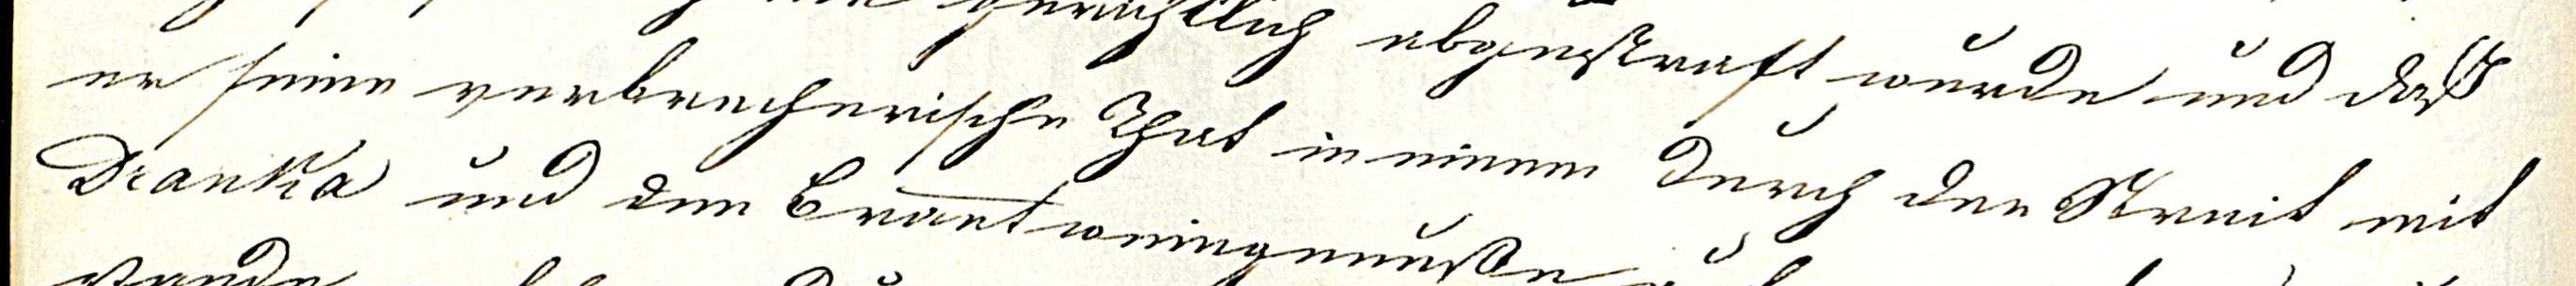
er seine verbrecherische That in einem durch den Streit mit
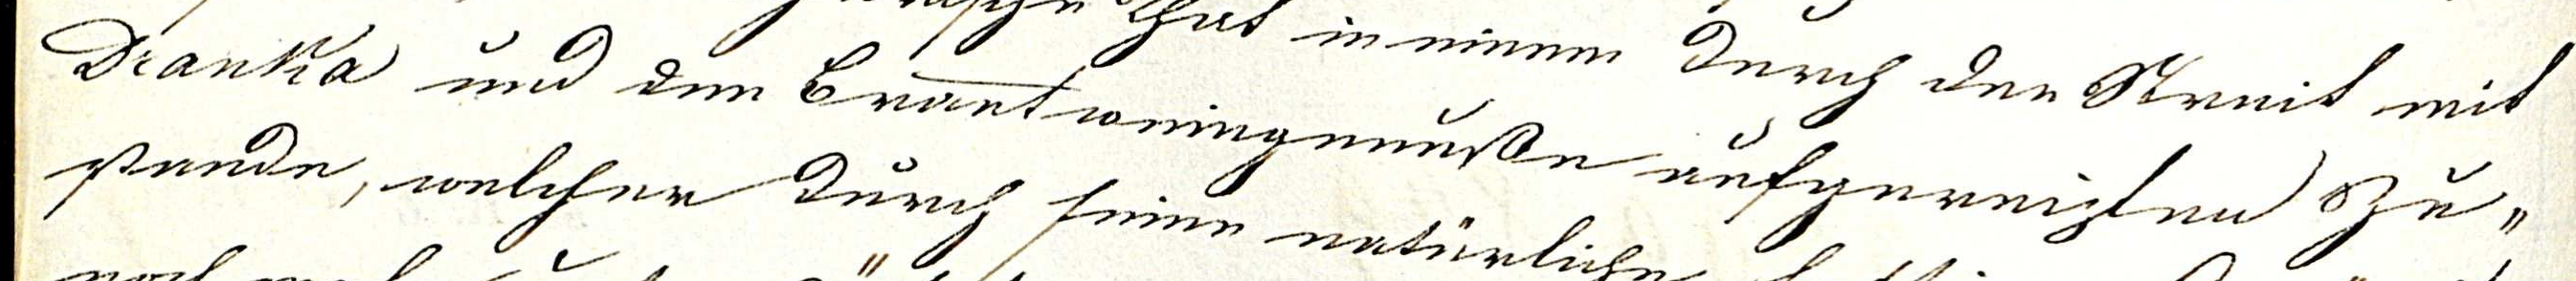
Dranka und den Brantweingenuße aufgereizten Zu¬
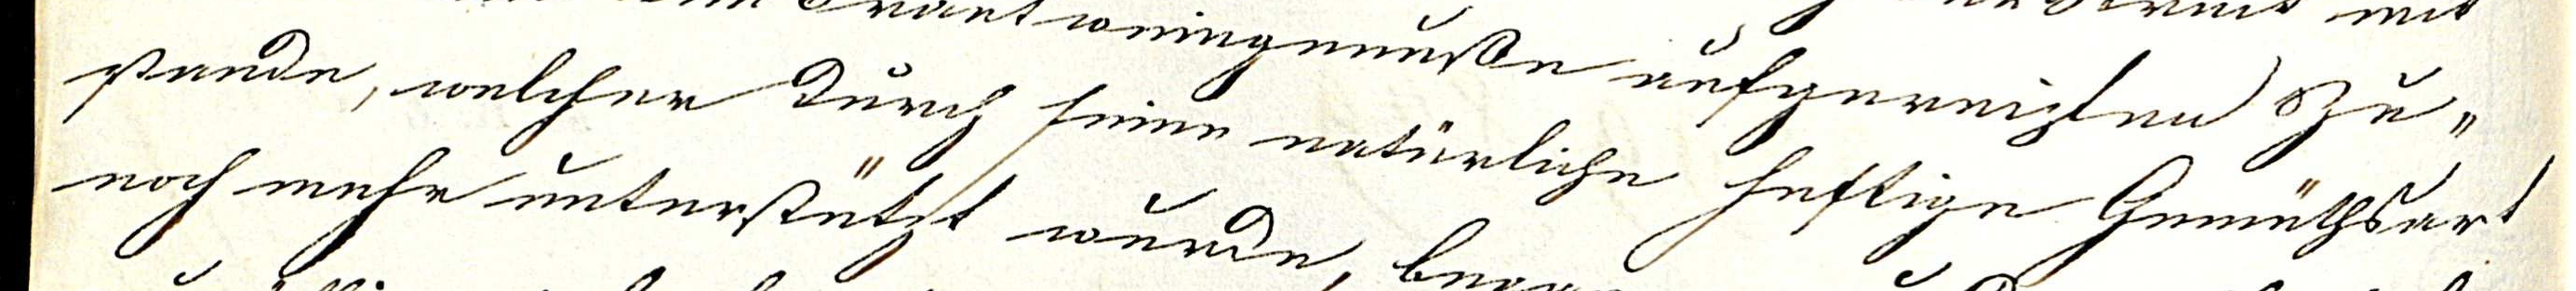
stande, welcher durch seine natürliche heftige Gemüthsart
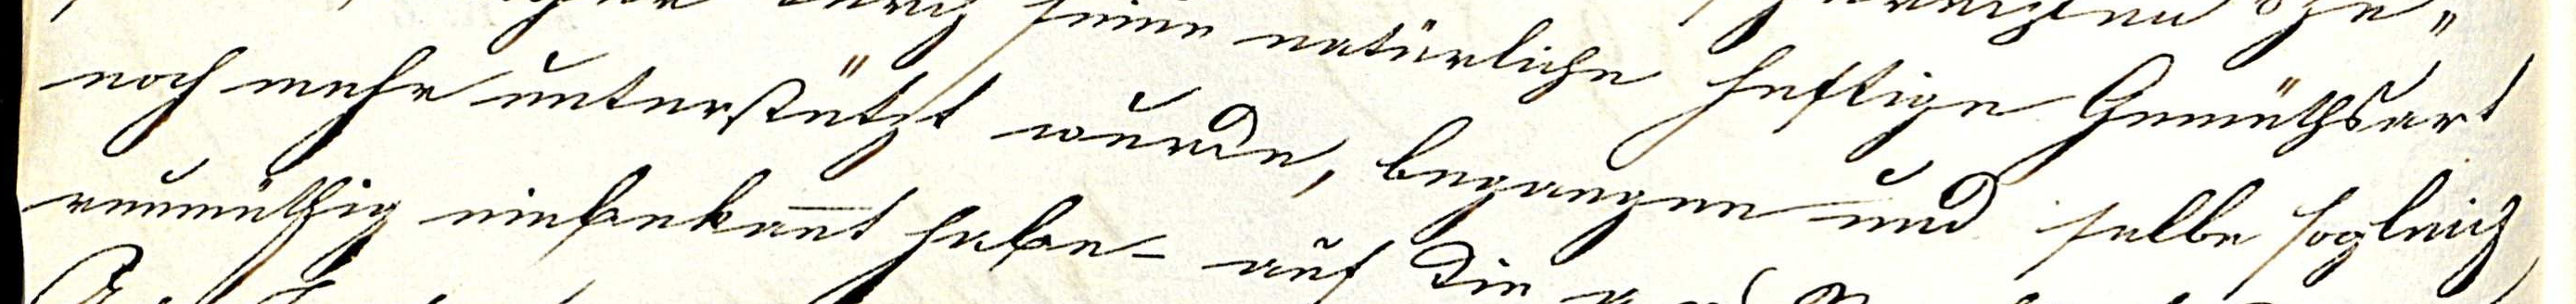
noch mehr unterstützt wurde, begangen und selbe sogleich
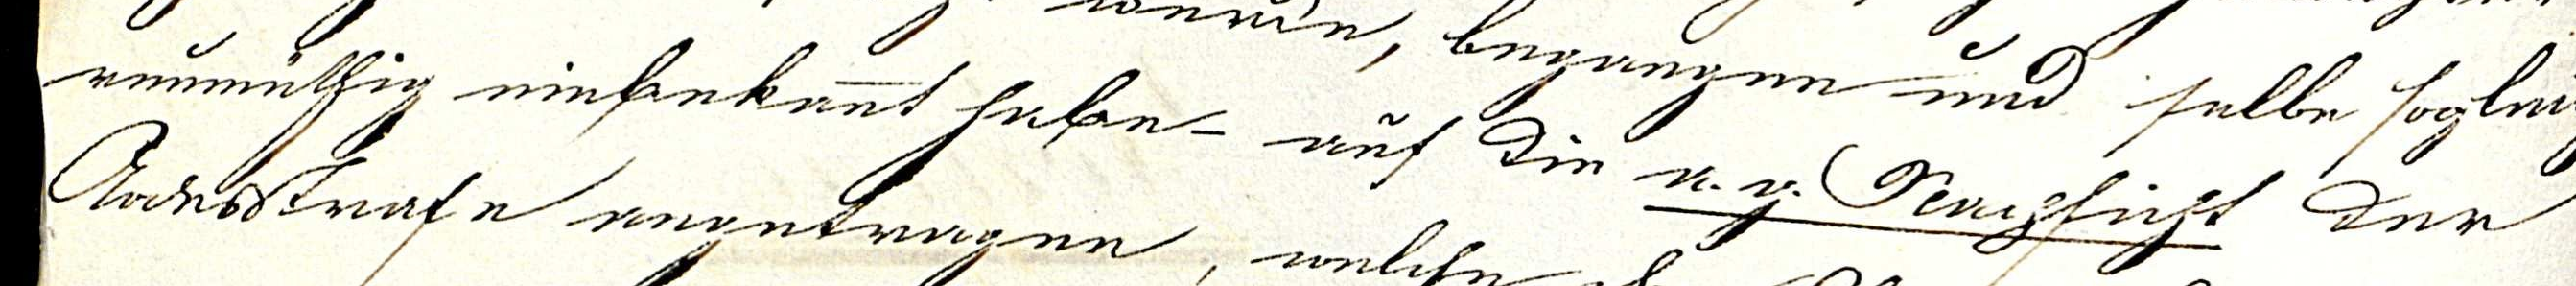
reumüthig einbekannt habe - auf die a. g. Nachsicht der
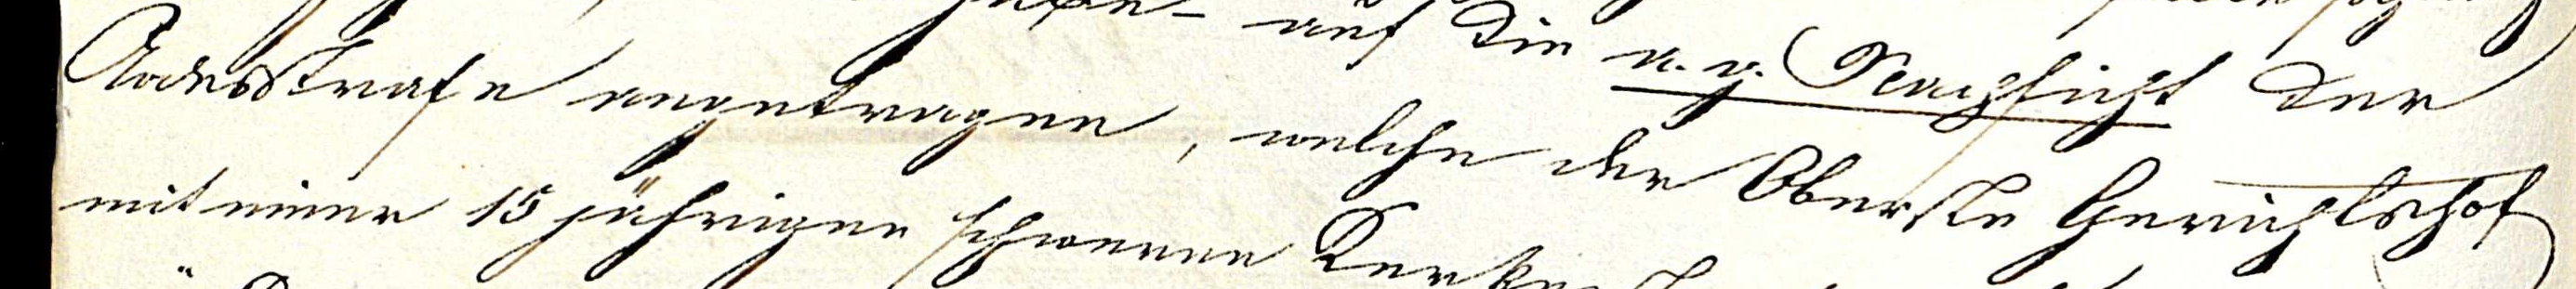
Todesstrafe angetragen, welche der Oberste Gerichtshof
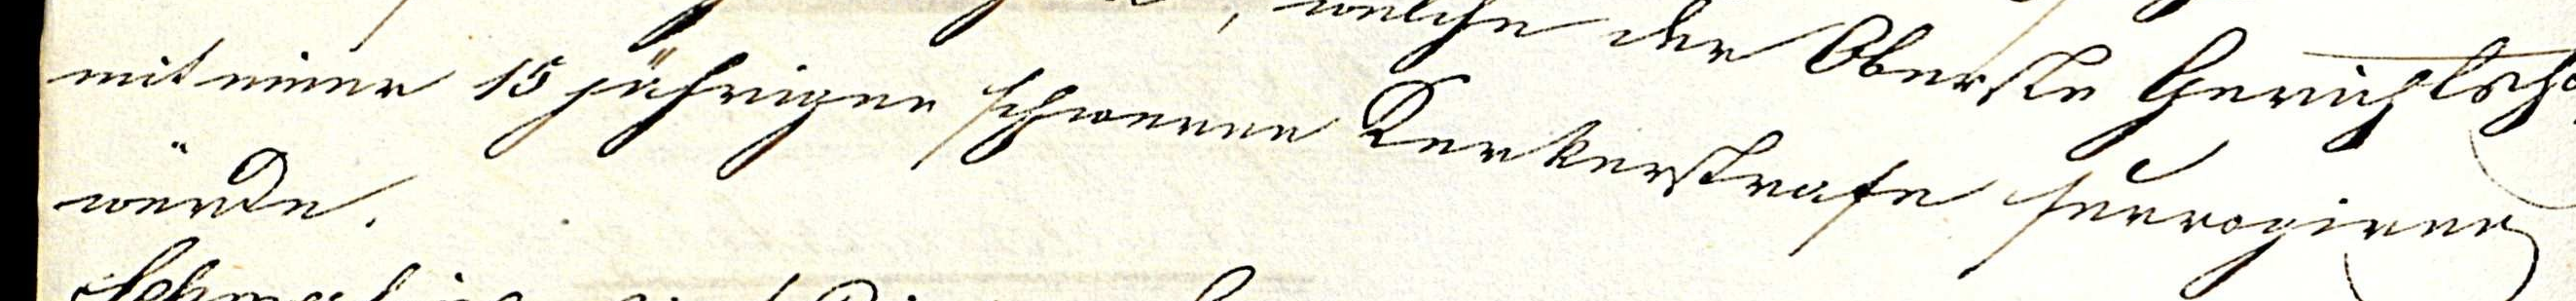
mit einer 15 jährigen schweren Kerkerstrafe surrogiren
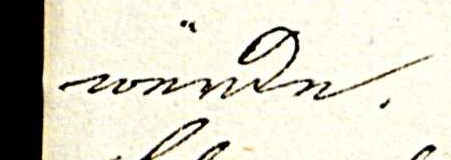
würde.
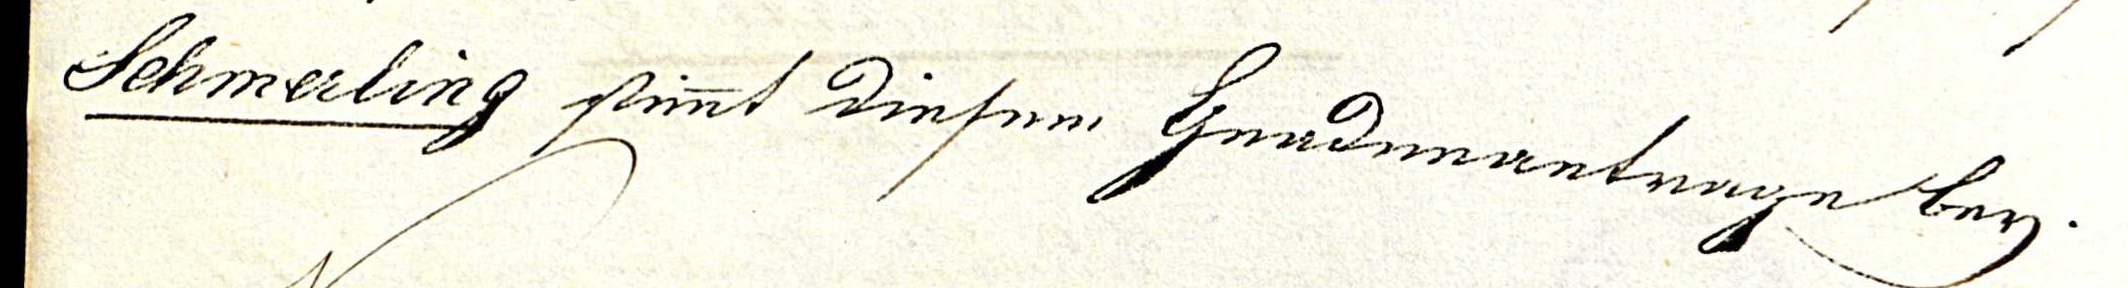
Schmerling stimmt diesem Gnadmantrage bey.
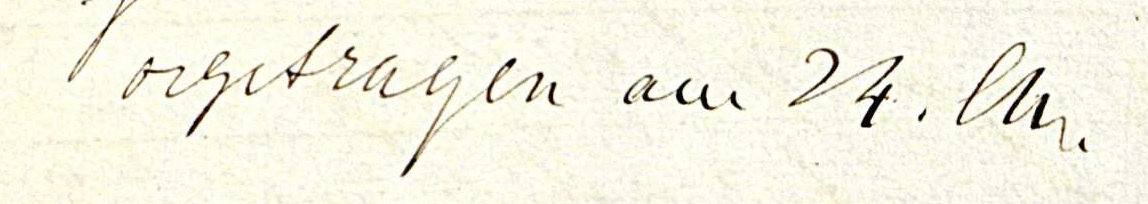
Vorgetragen am 24. xx
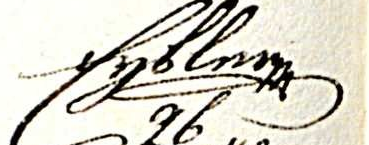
Eybler
